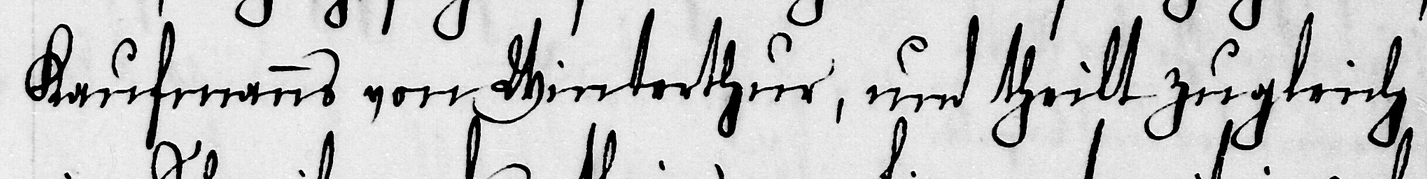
Kaufmanns von Winterthur, und theilt zugleich
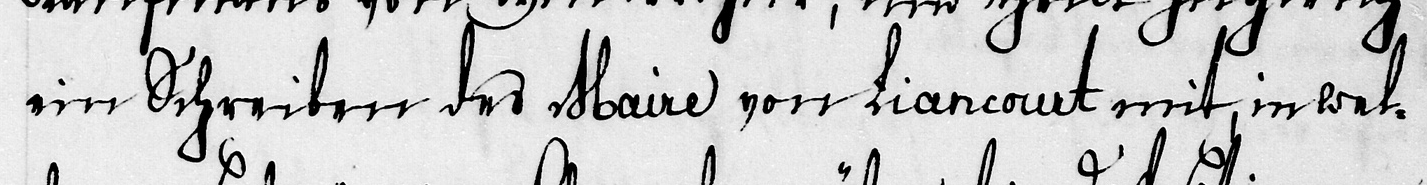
ein Schreiben des Maire von Liancourt mit, in wel¬
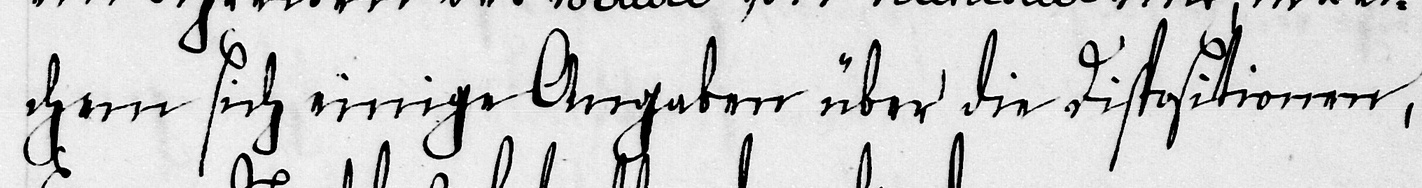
chem sich einige Angaben über die Dispositionen,
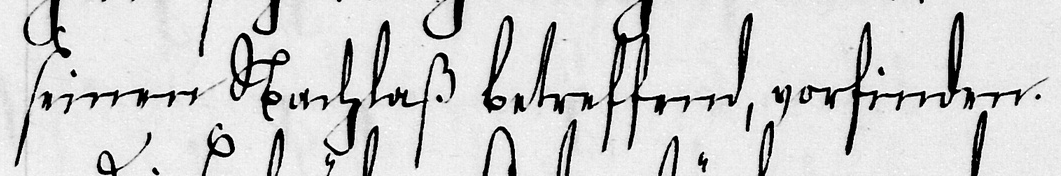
seinen Nachlaß betreffend, vorfinden.
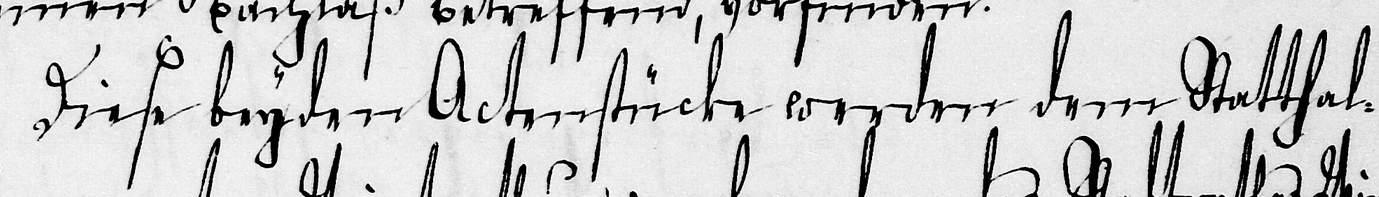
Diese beyden Actenstücke werden dem Statthal¬
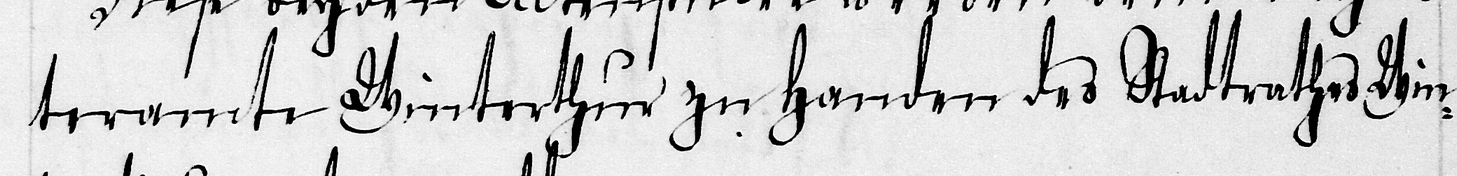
teramte Winterhur zu Handen des Stadtrathes Win¬
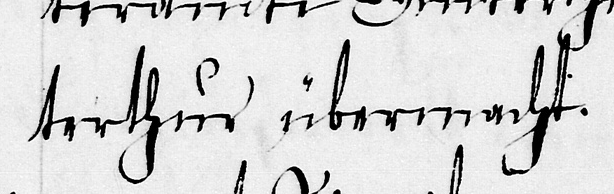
terthur übermacht.
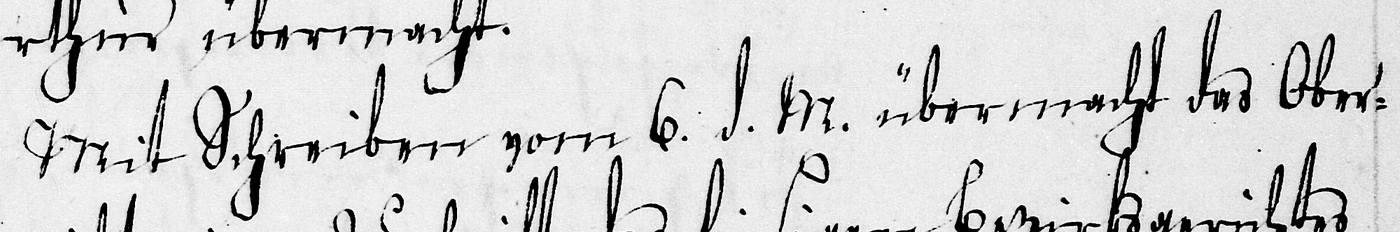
Mit Schreiben vom 6. d. M. übermacht das Ober¬
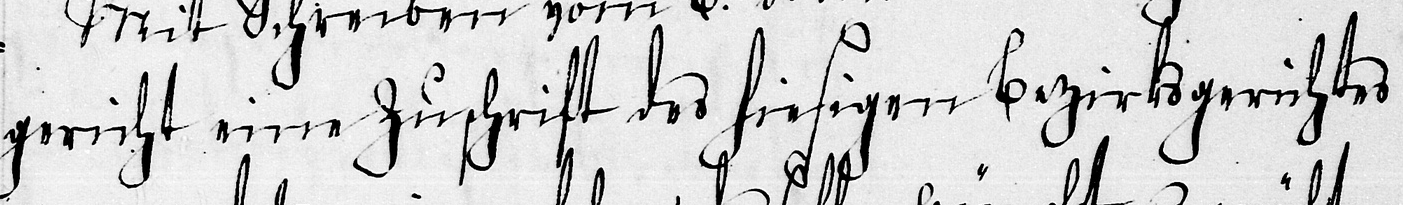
gericht eine Zuschrift des hiesigen Bezirksgerichtes
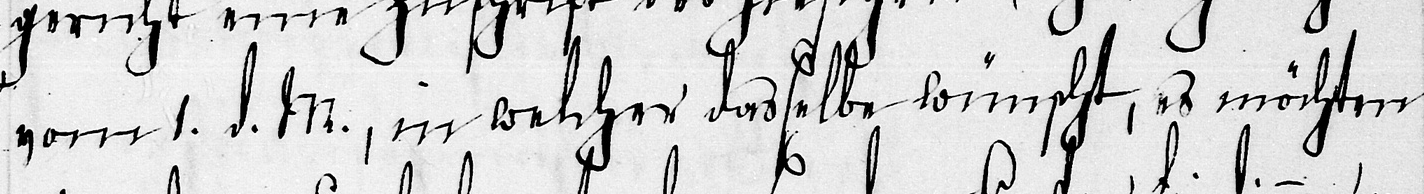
vom 1. d. M., in welcher dasselbe wünscht, es möchten
